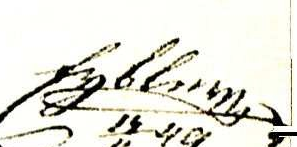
Eybler
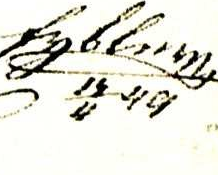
13/4 49
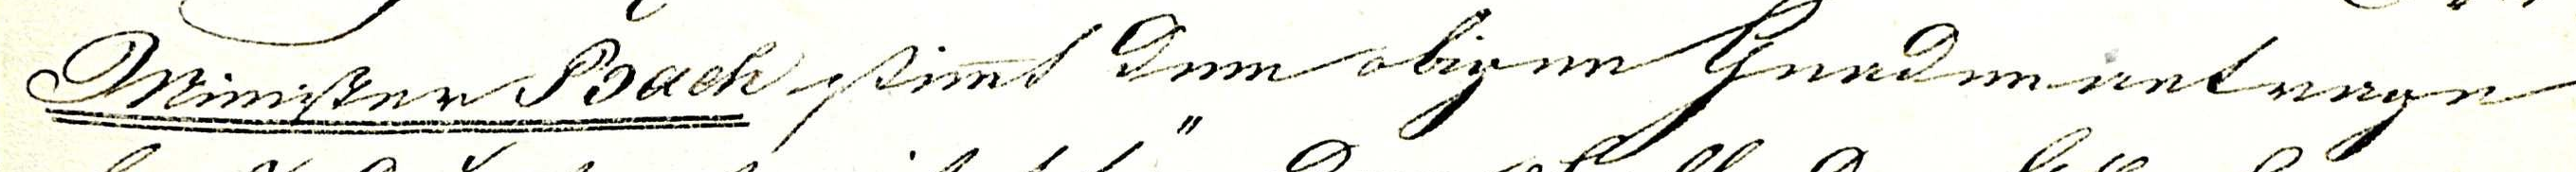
Minister Bach stimmt dem obigen Gnadenantrage
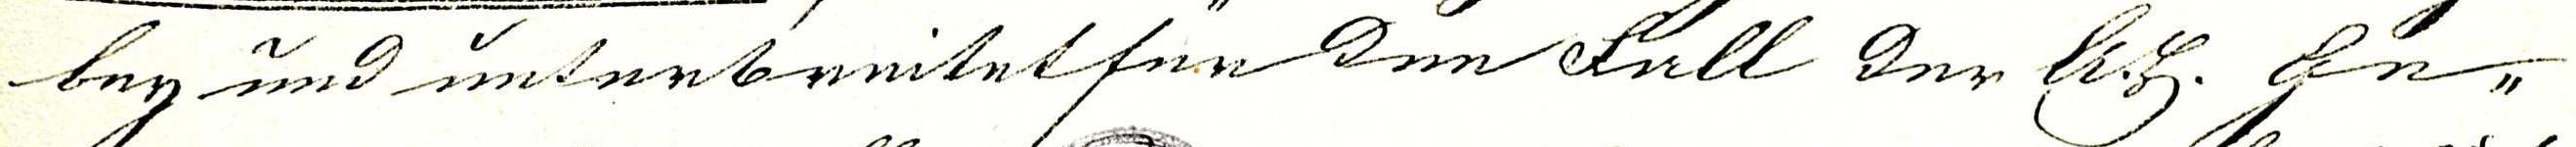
bey und unterbreitet für den Fall der A. H. Ge¬
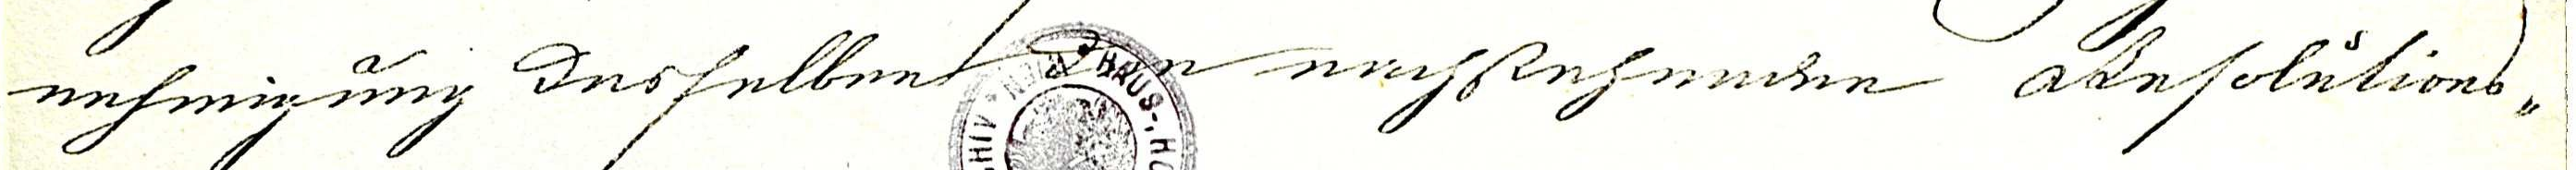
nehmigung desselben den nachstehenden Resolutions¬
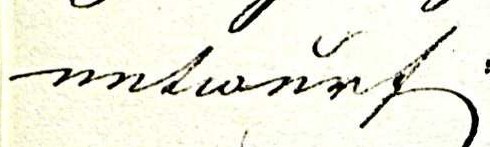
entwurf.
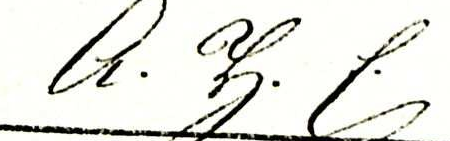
Ah. E.
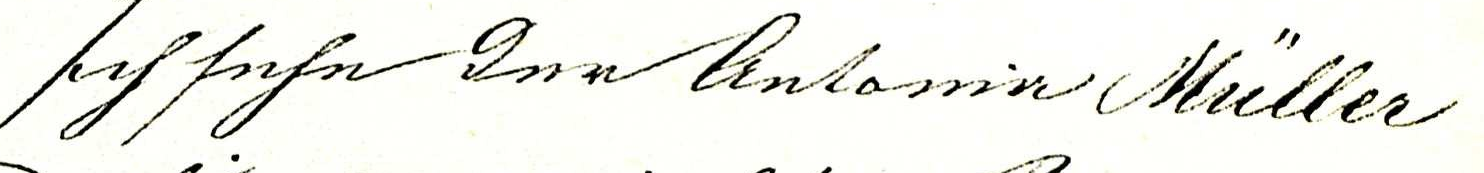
Ich sehe der Antonia Müller
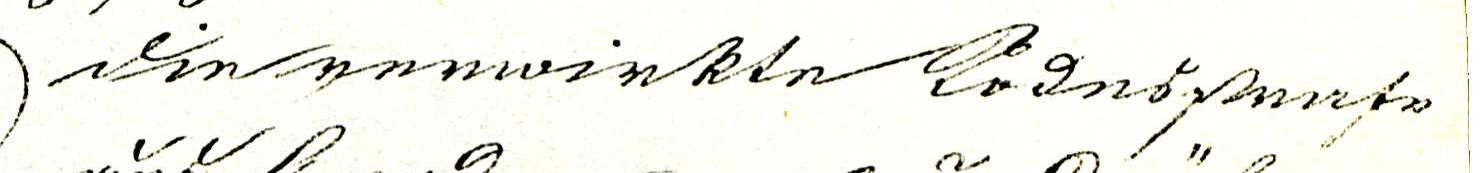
die verwirkte Todesstrafe
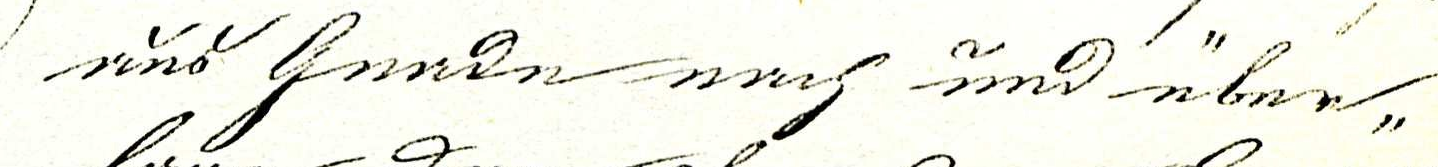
aus Gnade nach und über¬
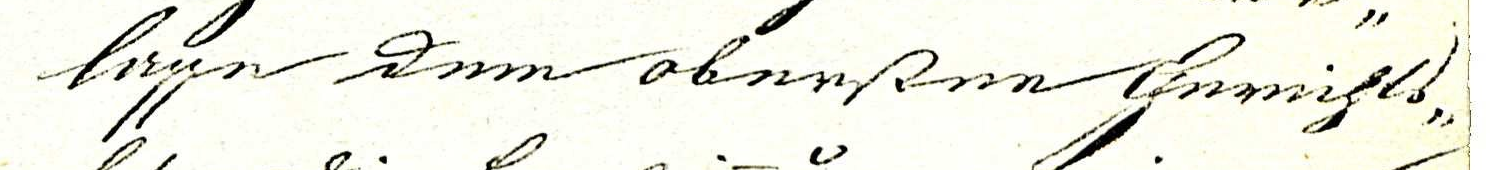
lasse dem obersten Gerichts¬
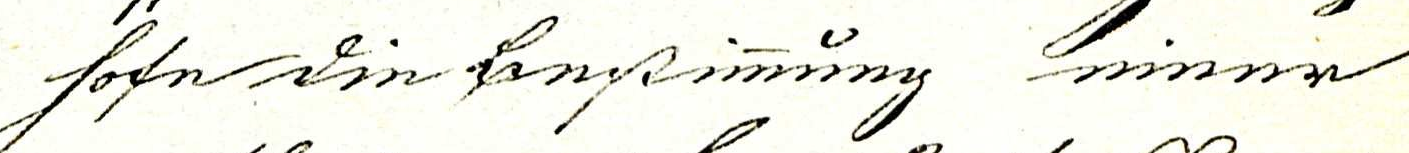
hofe die Bestimmung einer
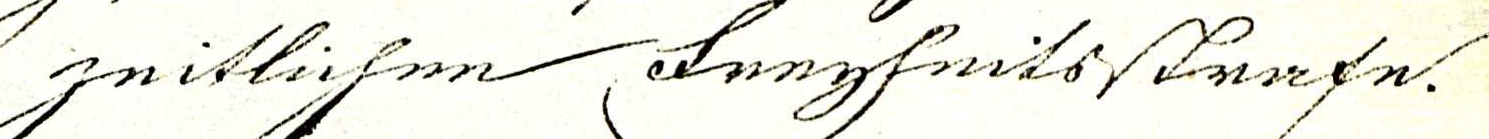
zeitlichen Freiheitsstrafe.
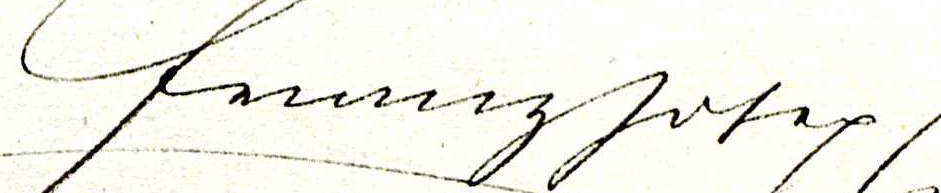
Franz Joseph
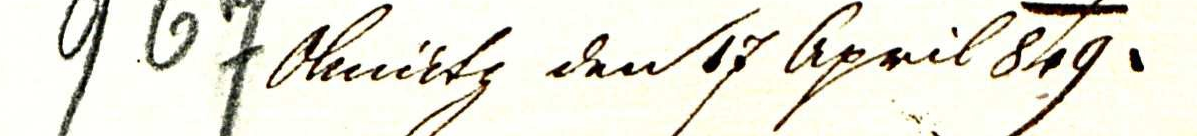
Olmütz den 17. April 1849
